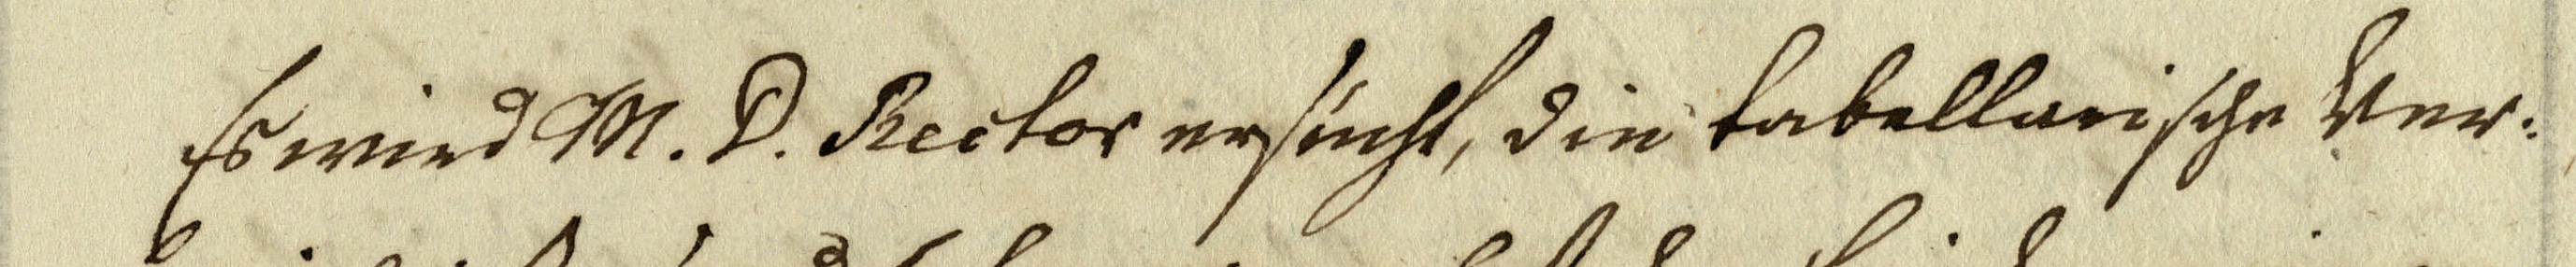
Es wird M. D. Rector ersucht, die tabellarische Ver¬
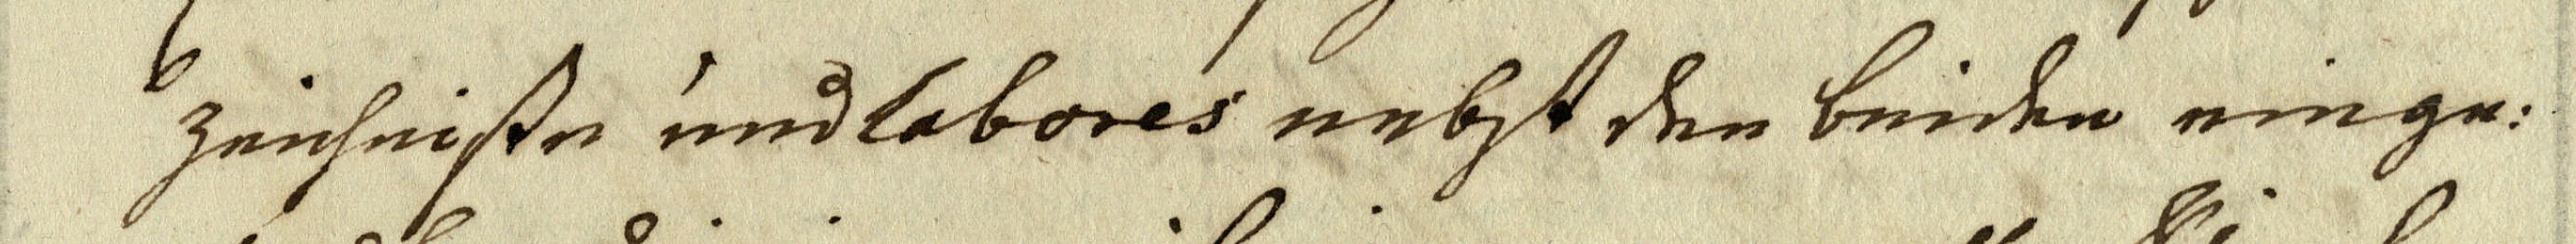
zeichniße und labores nebst den beiden einge¬
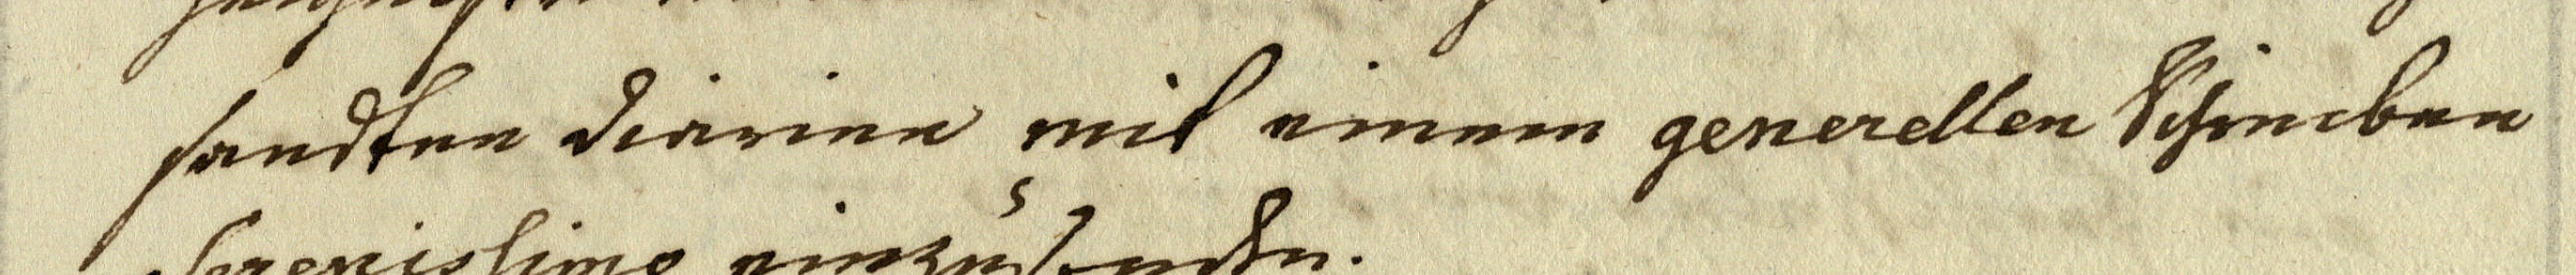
sandten diarien mit einem generellen Schreiben
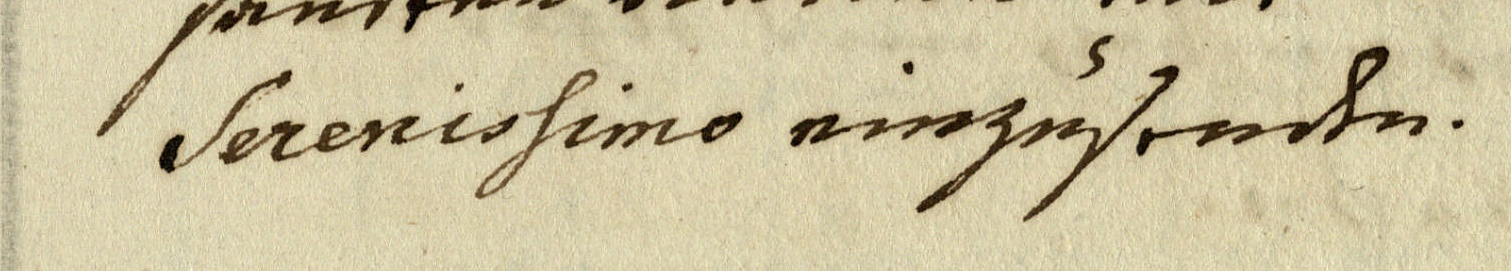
Serenissimo einzusenden.
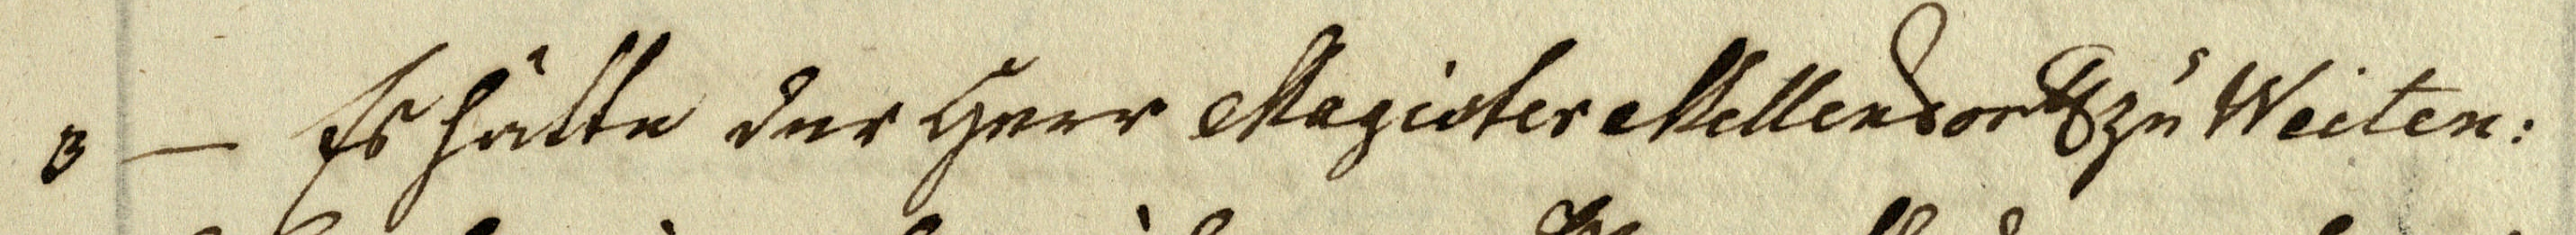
3. Es hätte der Herr Magister Mellendorff zu Weiten¬
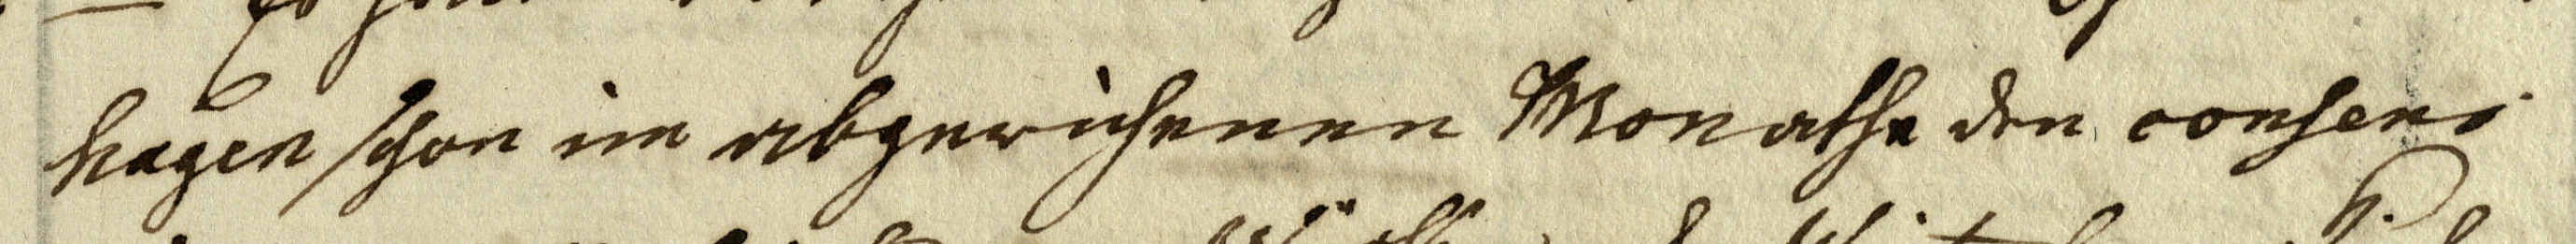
hagen schon im abgewichenen Monathe den consens
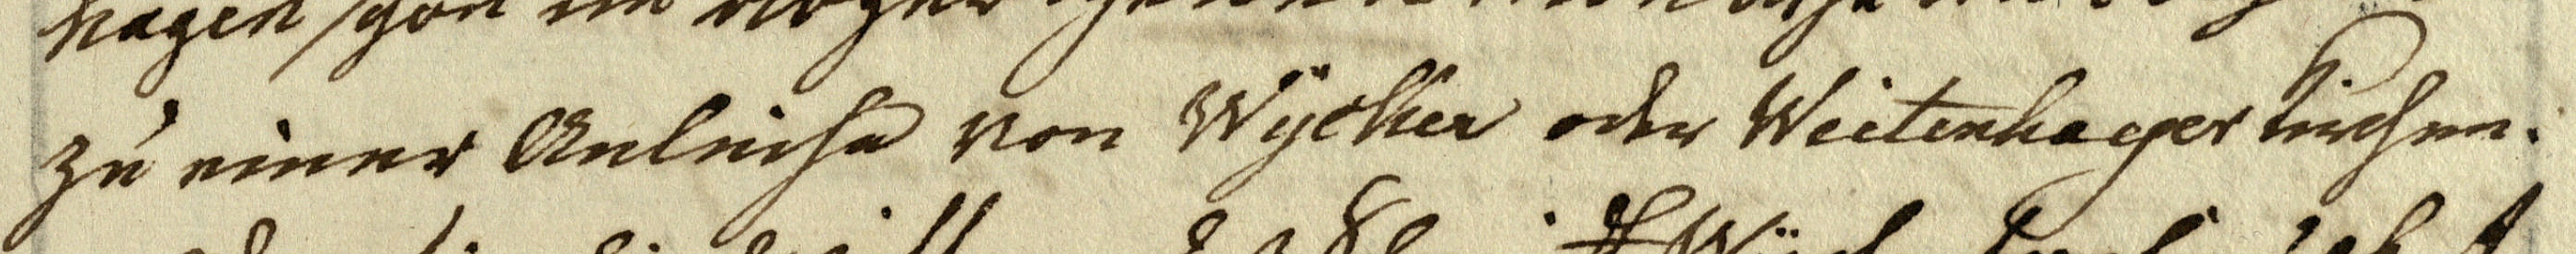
zu einer Anleihe von Wÿcker oder Weitenhhaeger Kirchen¬
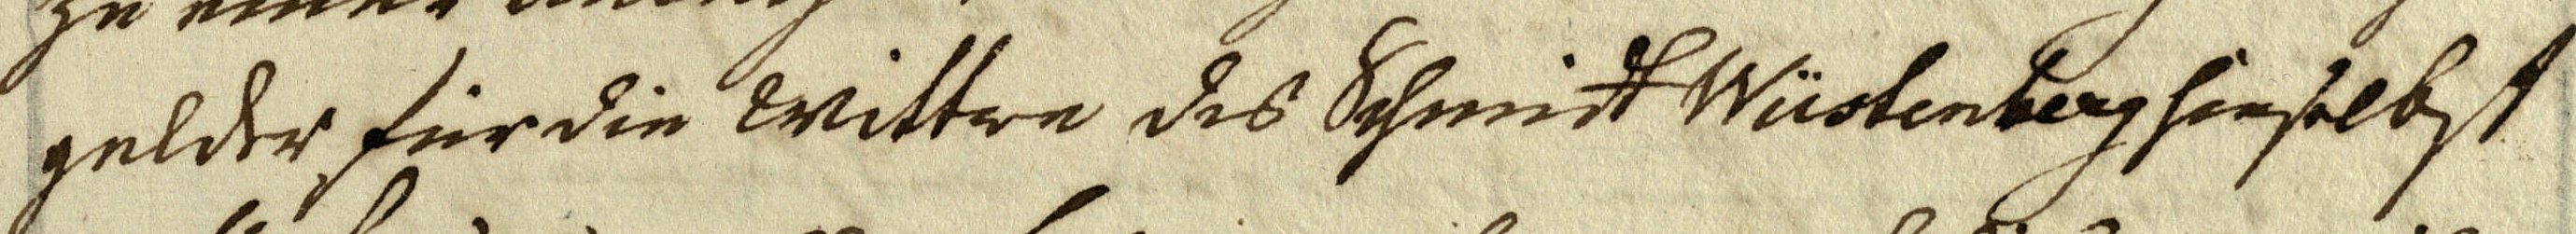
gelder für die Wittwe des Schmidt Wüstenberg hieselbst
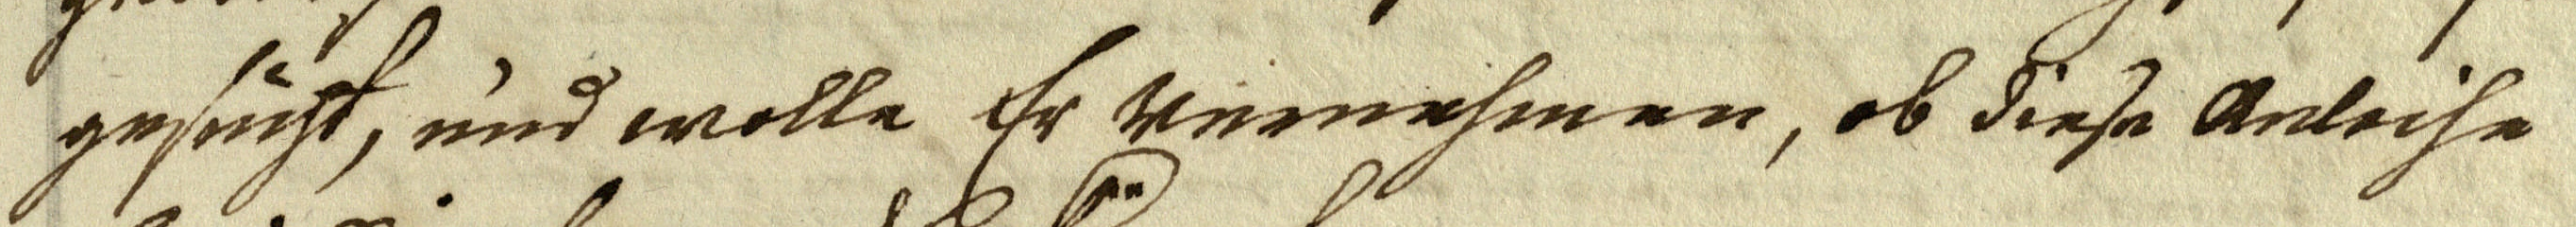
gesucht, und wolle Er vernehmen, ob diese Anleihe
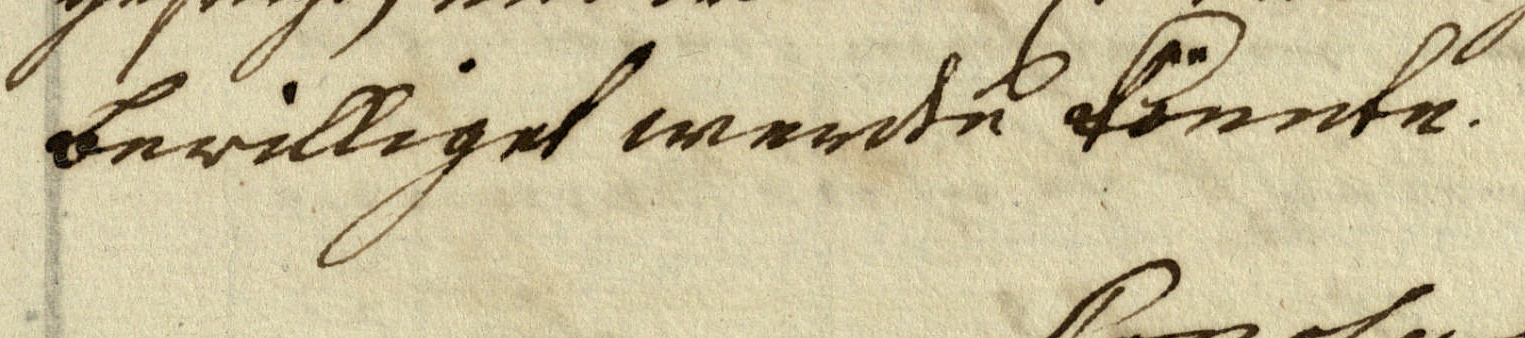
bewilliget werden könnte.
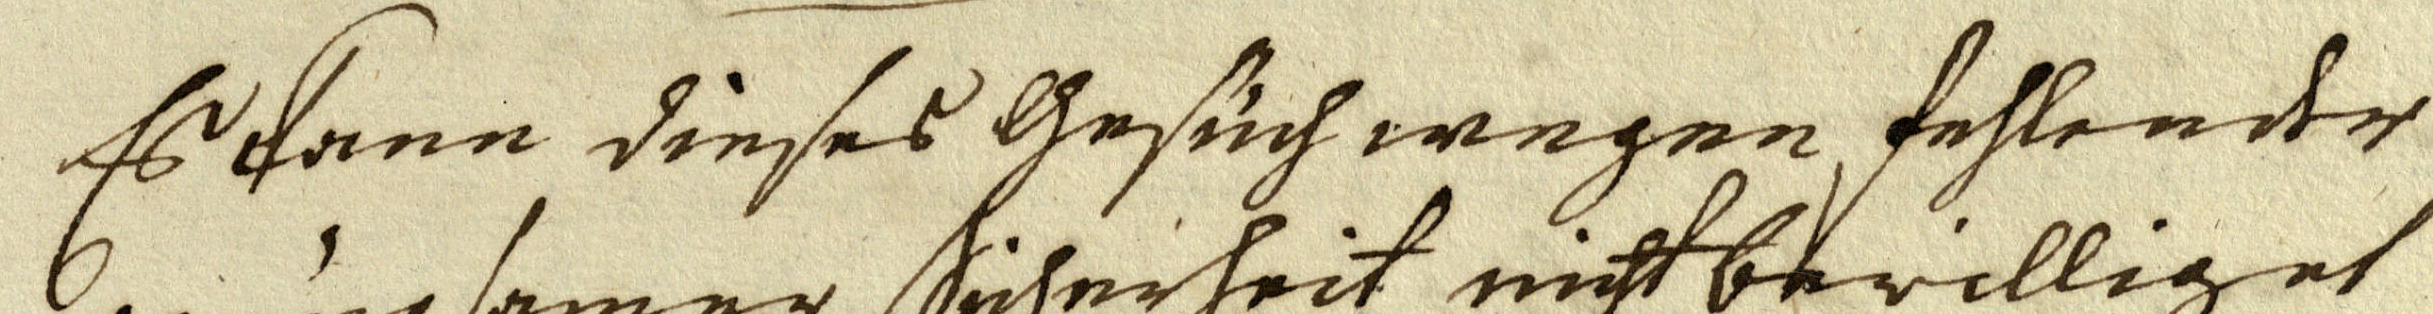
Es kann dieses Gesuch wegen fehlender
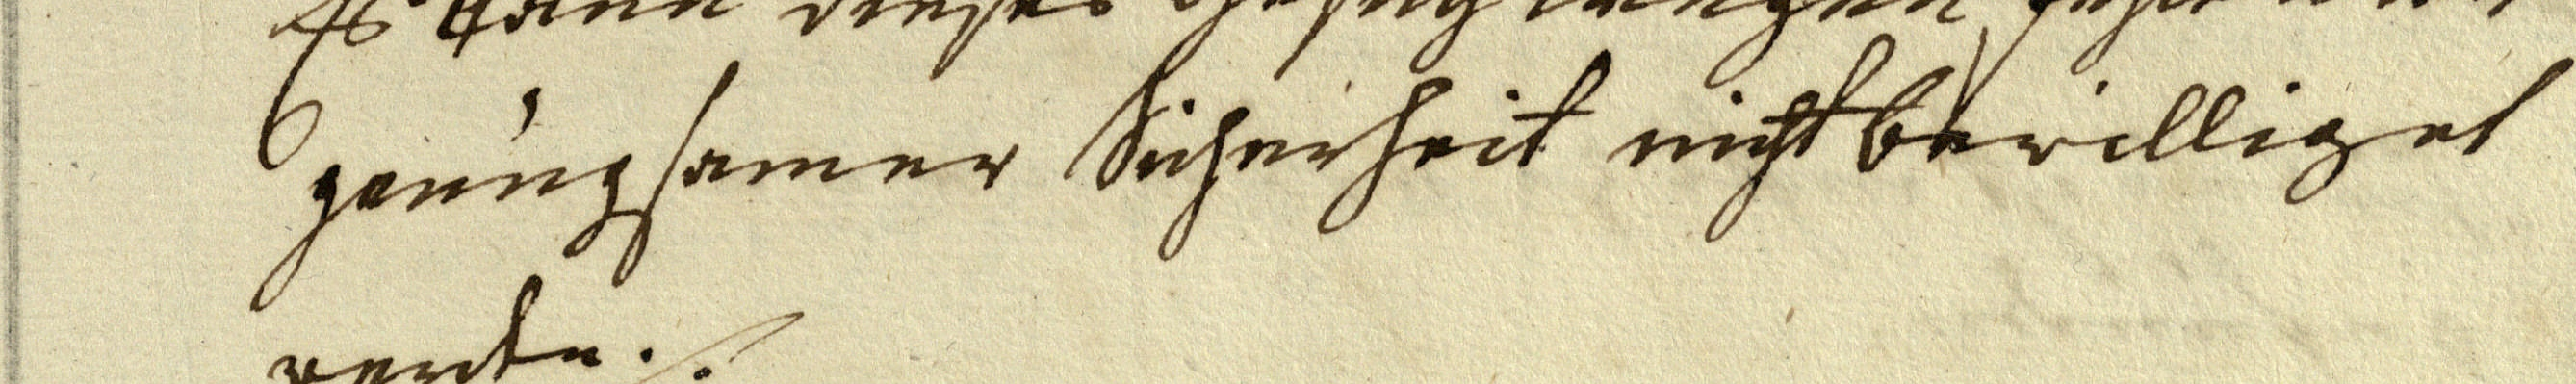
genügsamer Sicherheit nicht bewilliget
